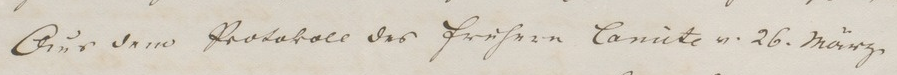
Aus dem Protokoll des frühern Comite v. 26. März
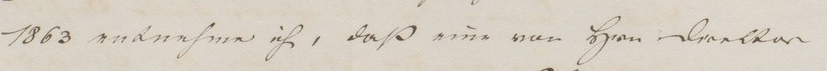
1863 entnehme ich, daß eine von Hrn Direktor
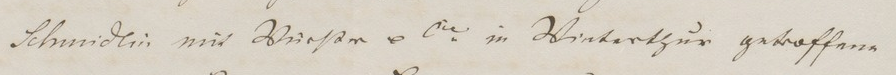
Schmidlin mit Wurster & Cie in Winterthur getroffene
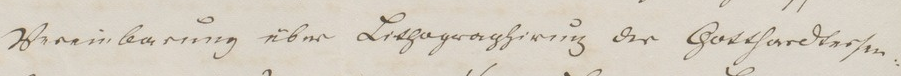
Vereinbarung über Lithographirung der Gotthardteisen-
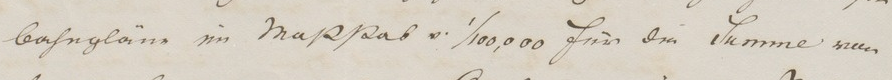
bahnpläne im Maßstab v. 1/100,000 für die Summe von
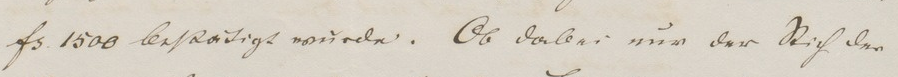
fs. 1500 bestätigt wurde. Ob dabei nur der Stich der
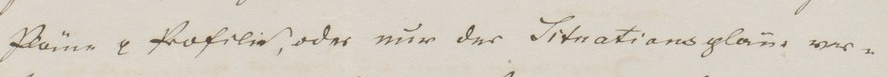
Pläne & Profile, oder nur der Situationspläne ver-
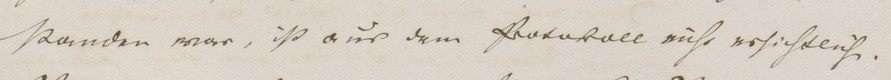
standen war, ist aus dem Protokoll nicht ersichtlich.
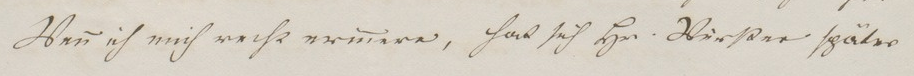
Wenn ich mich recht erinnere, hat sich Hr. Wurster später
